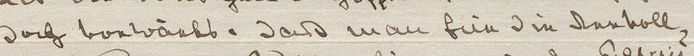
doch vorwärts. Daß man für die Vervoll-
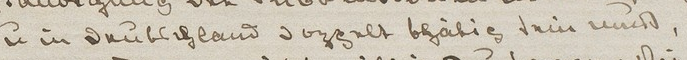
u in Deutschland doppelt thätig sein muß,
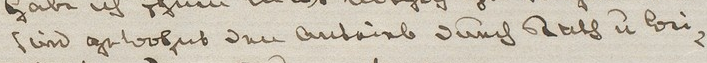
sind gewohnt den Antrieb durch Rath u Bei-
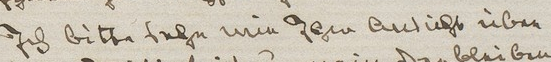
Ich bitte sehr mir Ihre Ansicht über
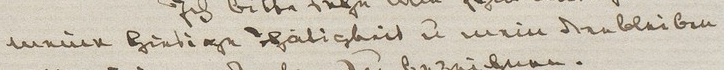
meine hiesige Thätigkeit u mein Verbleiben
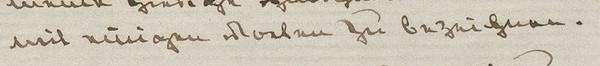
mit einigen Worten zu bezeichnen.
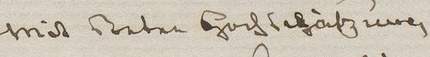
Mit steter Hochschätzung
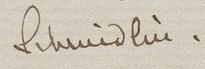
Schmidlin.
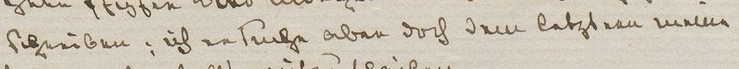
schreiben; ich ersuche aber doch dem letztern meine
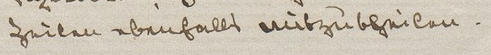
Zeilen ebenfalls mitzutheilen.
